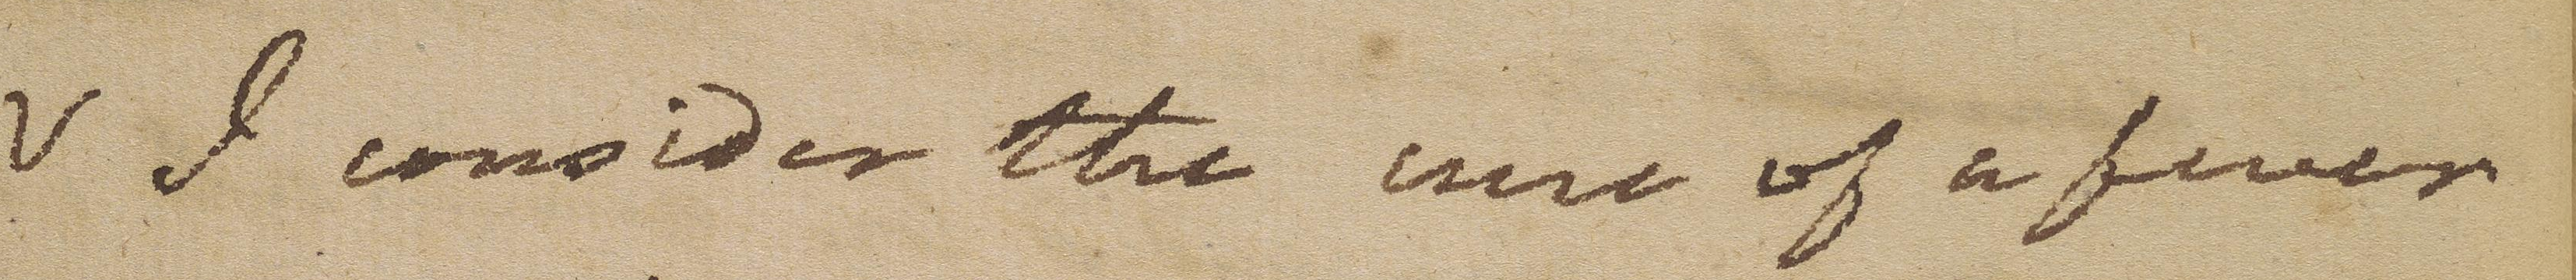V I consider the cure of a fever
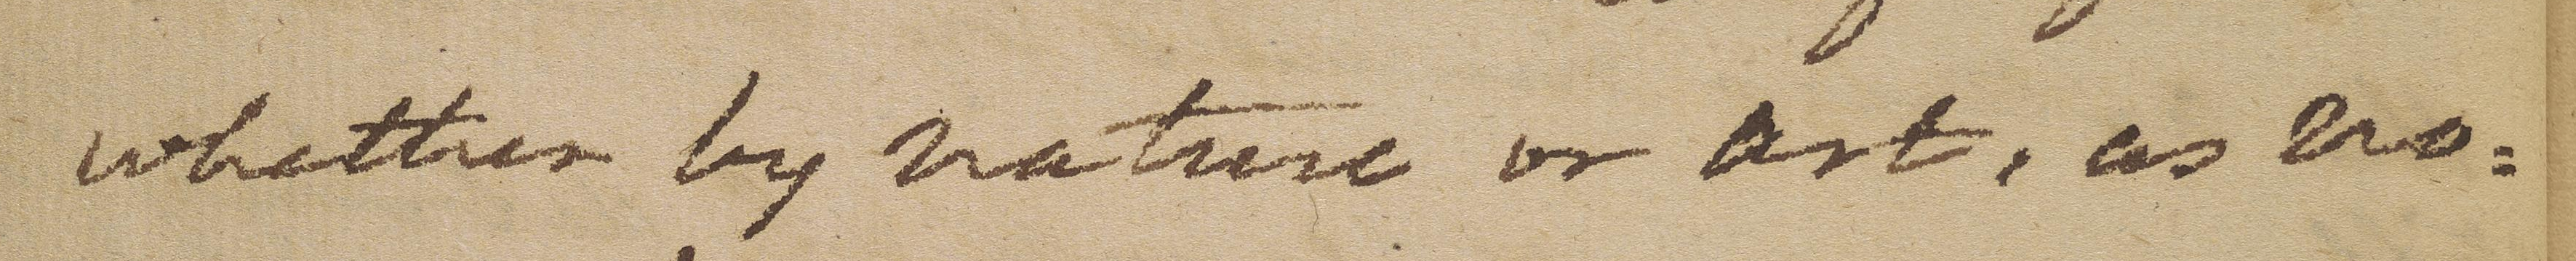whether by nature or art, as no-
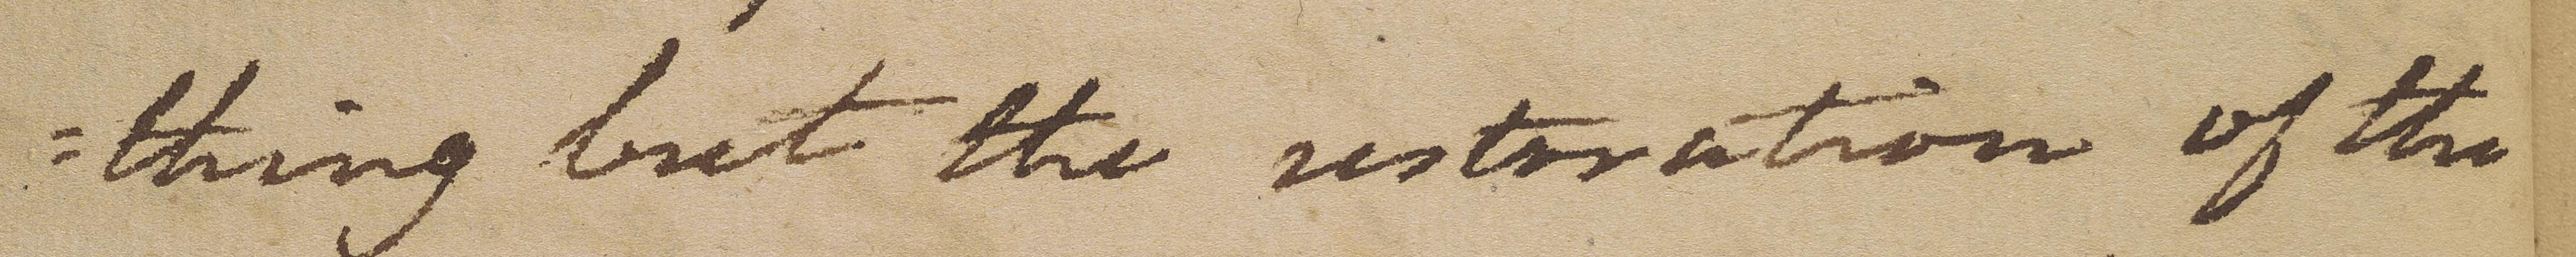-thing but the restoration of the
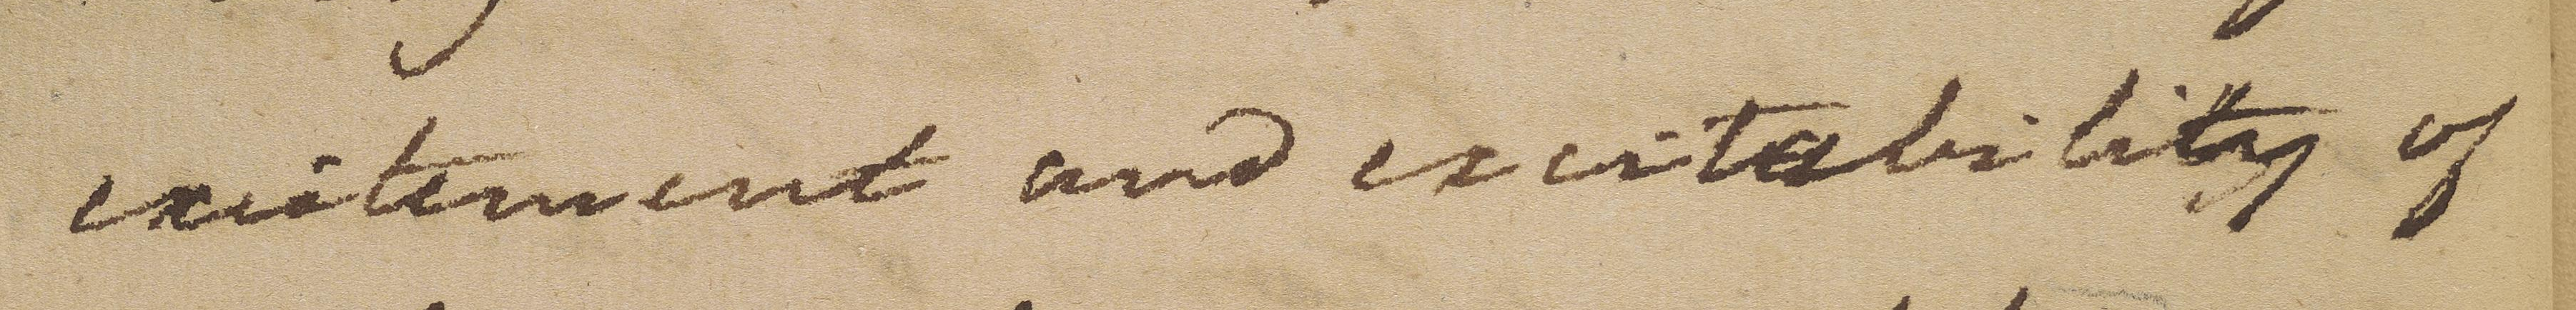excitement and excitability of
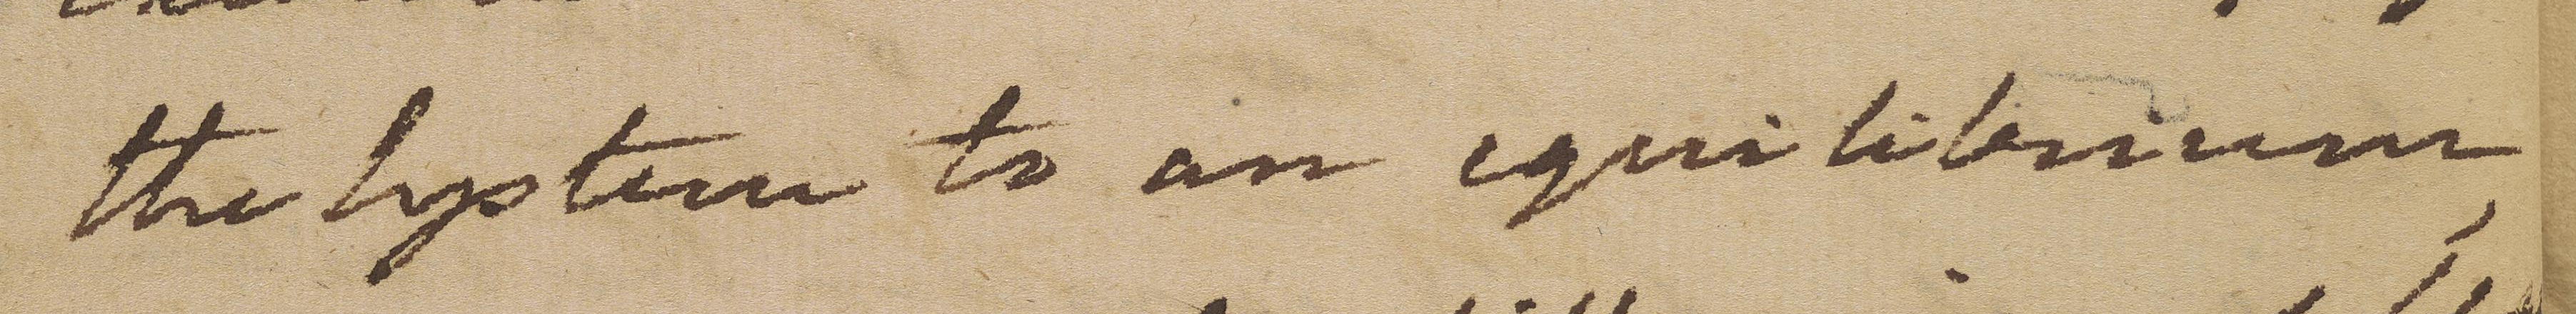the system to an equilibrium
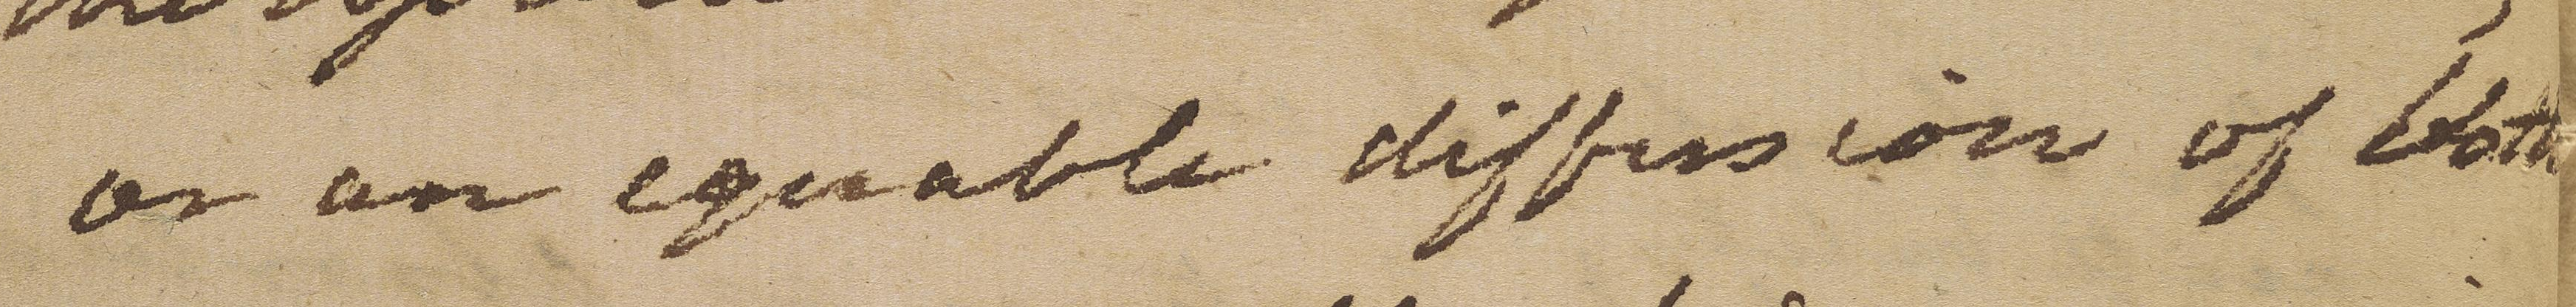or an equable diffusion of both
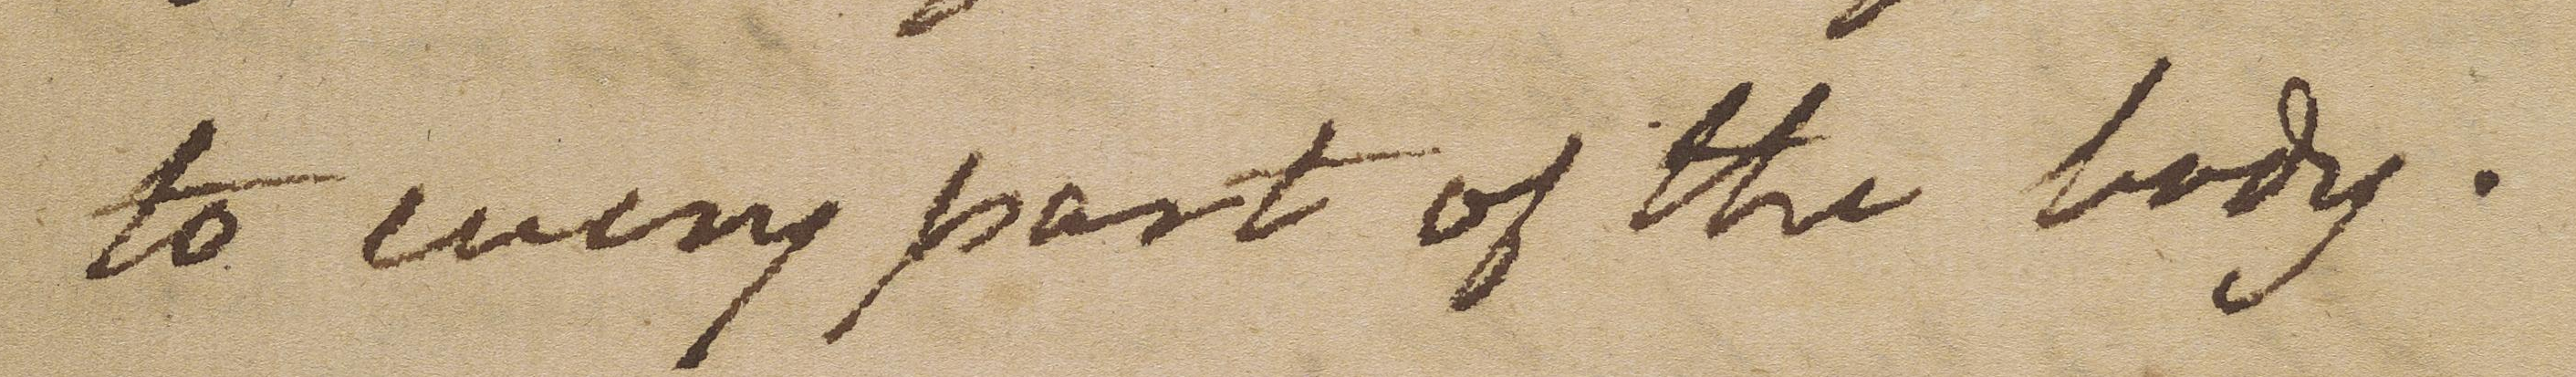to every part of the body.
